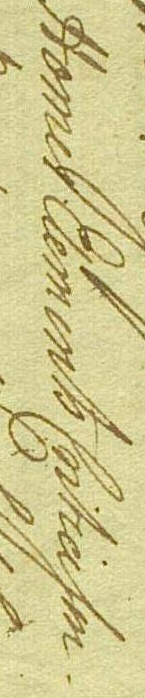Homer Elements Criticism
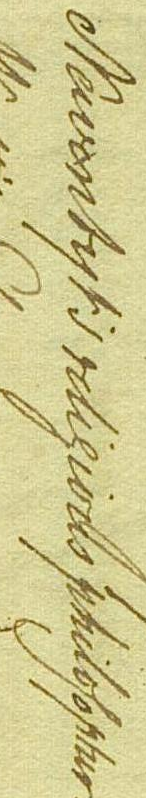Naventyr's religious philosopher.
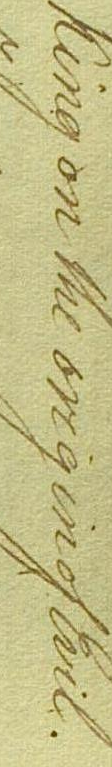King on the origin of Evil.
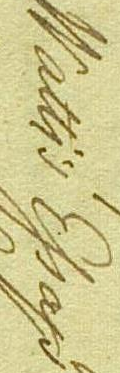Watts's Essays
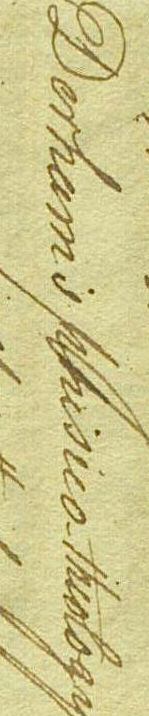Derham's phisico-theology.
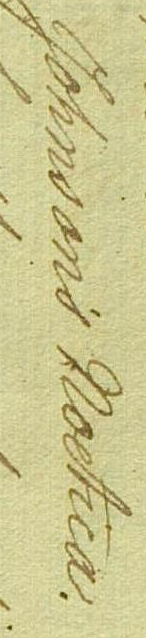Johnson's Noetica.
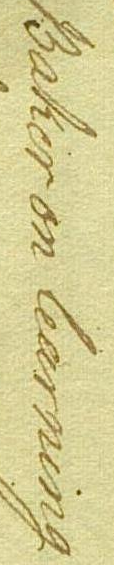Baker on learning.
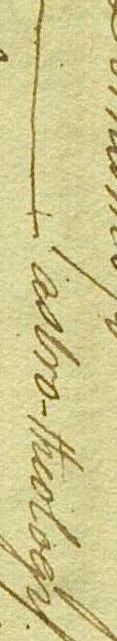––––– astro-theology.
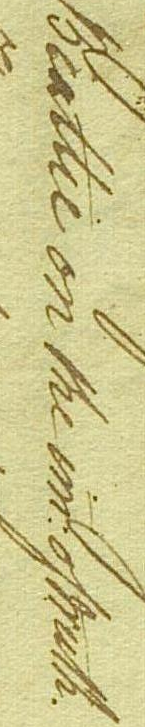Beattie on the im. of truth.
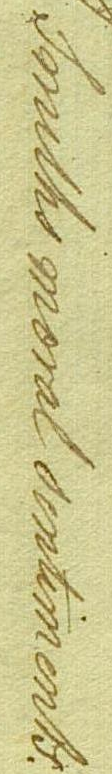Smiths moral sentiments.
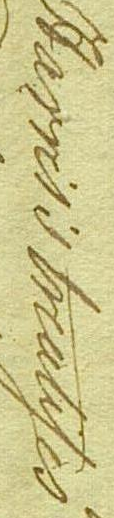Harris's treatises
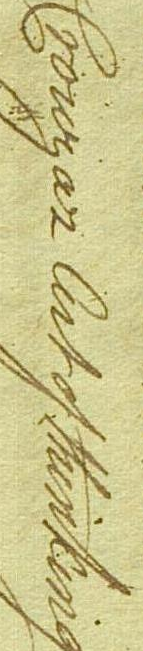Crouzar Art of thinking.
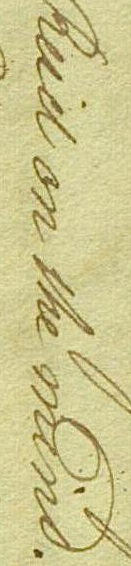Reid on the mind.
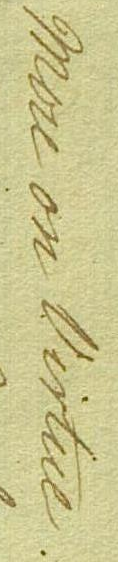More on Virtue.
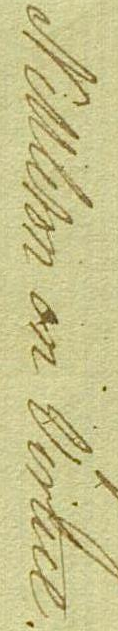V Milton on Virtue.
